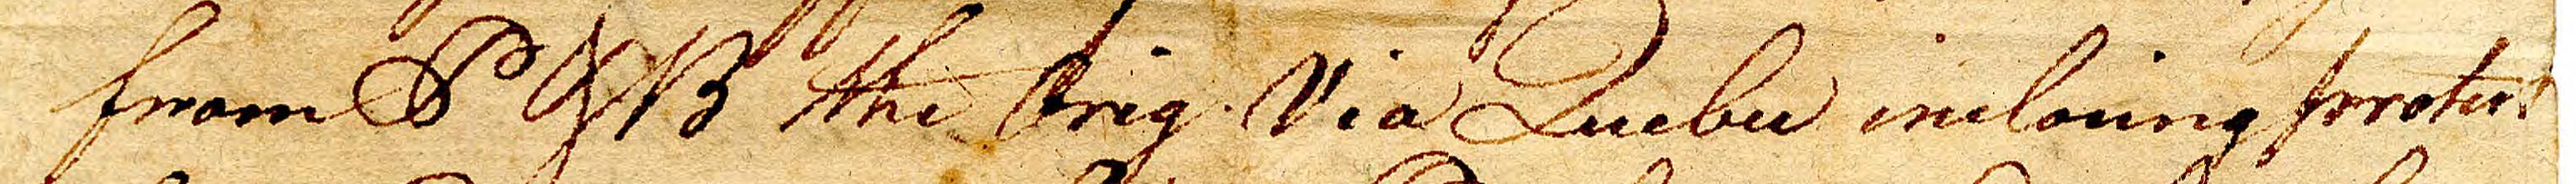from P & B the Brig. Via Quebec including protect
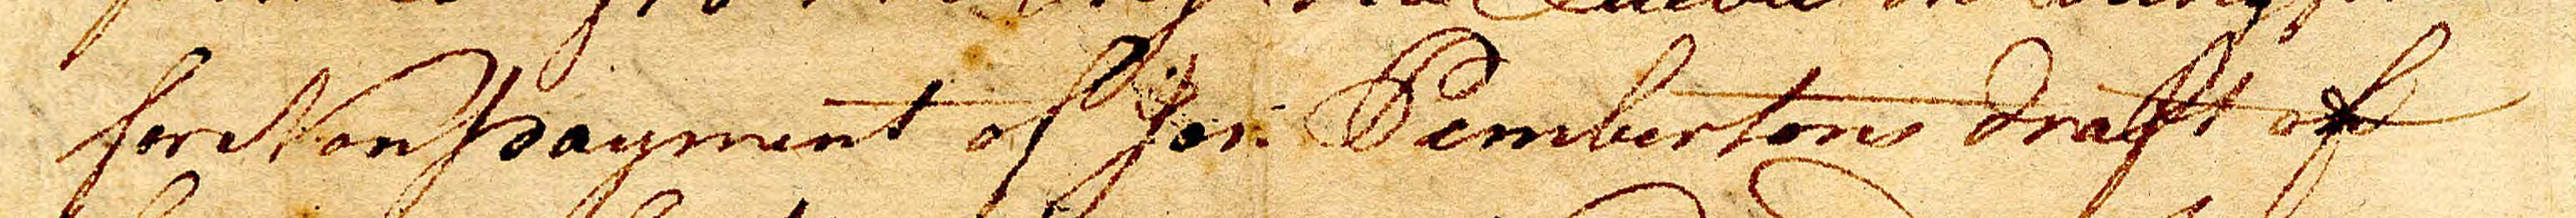for Non Payment of Jos: Pembertons draft of
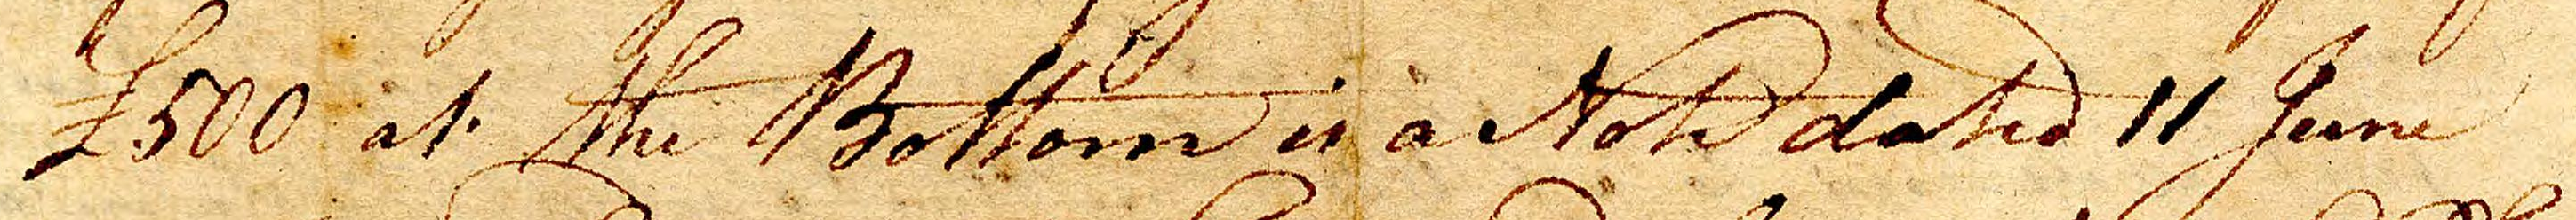£500 at the Bottom is a Note dated 11 June
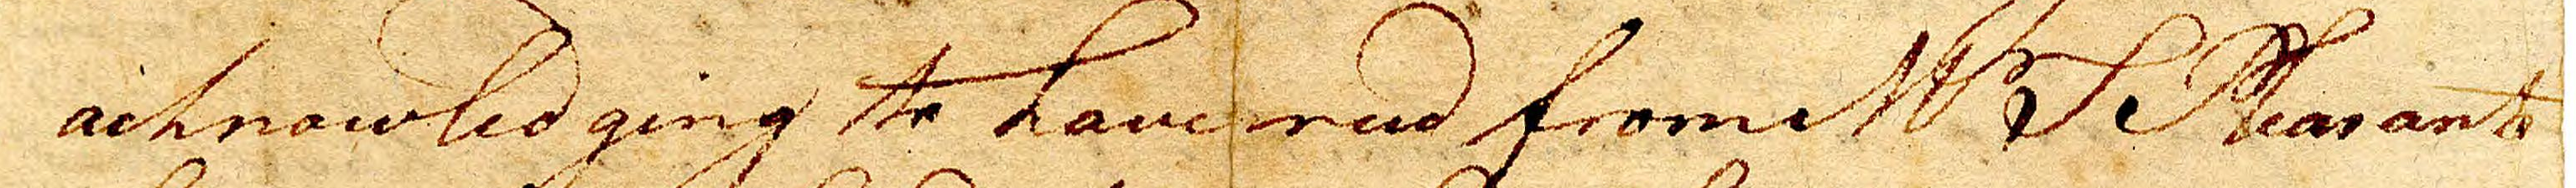acknowledging to have recd from M^r S Pleasants
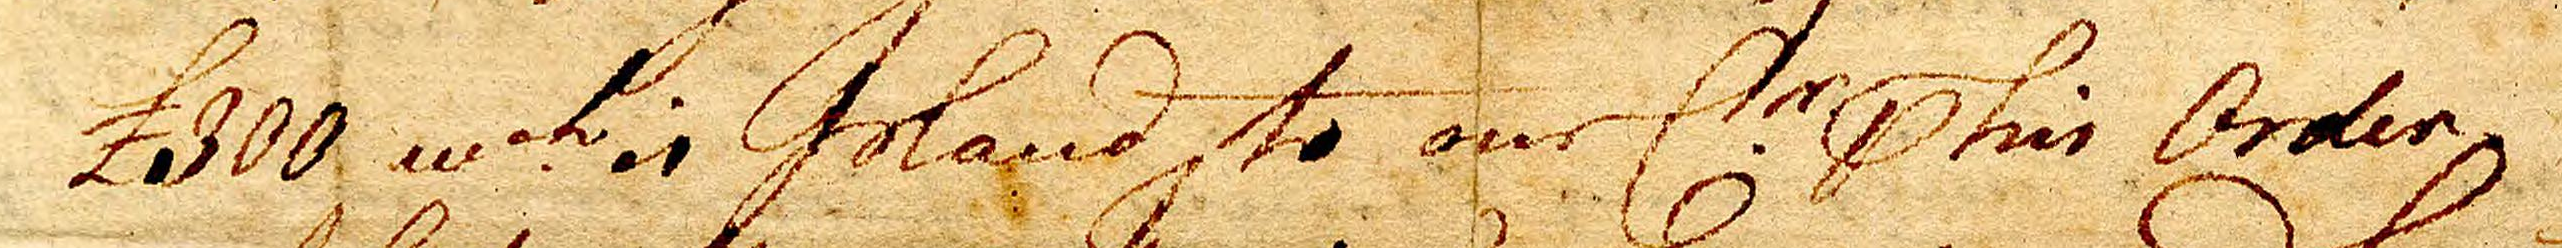£300 w^ch. is pland to our C^r. per his Order
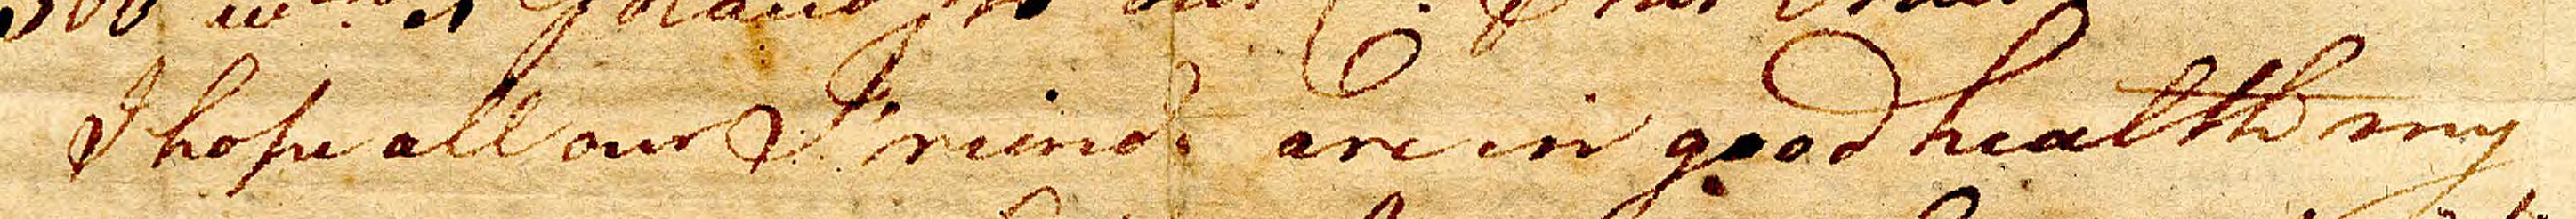I hope all our Friends are in good health my
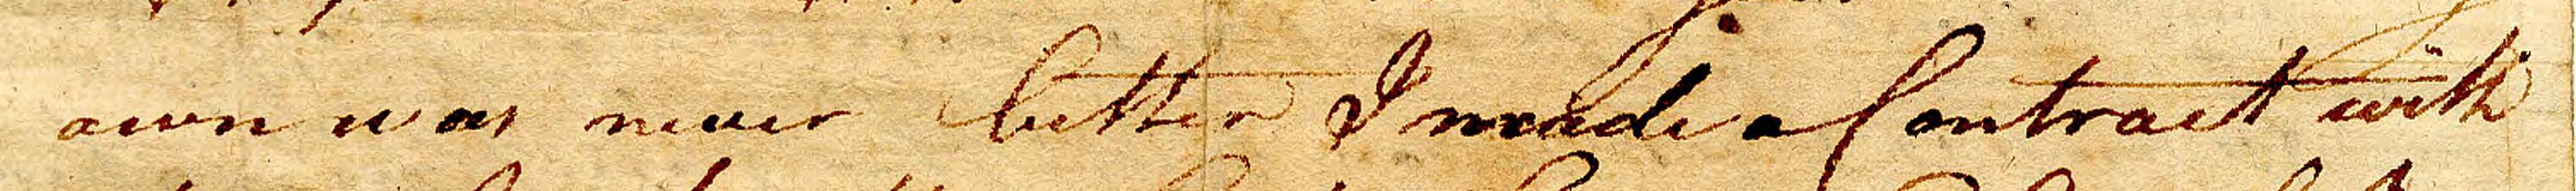own was never better I made a Contract with
